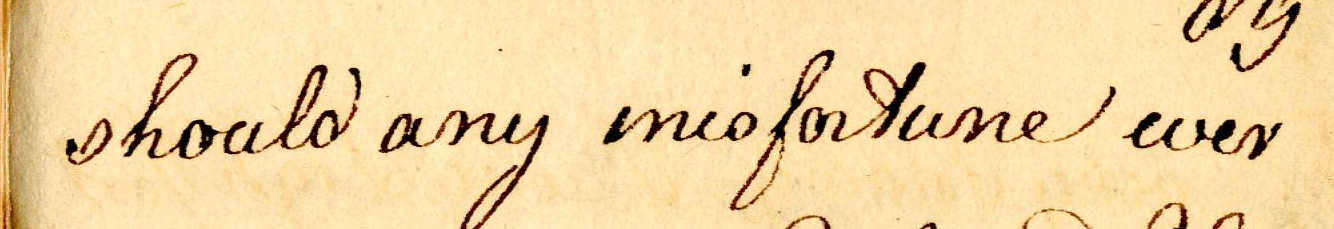should my misfortune ever
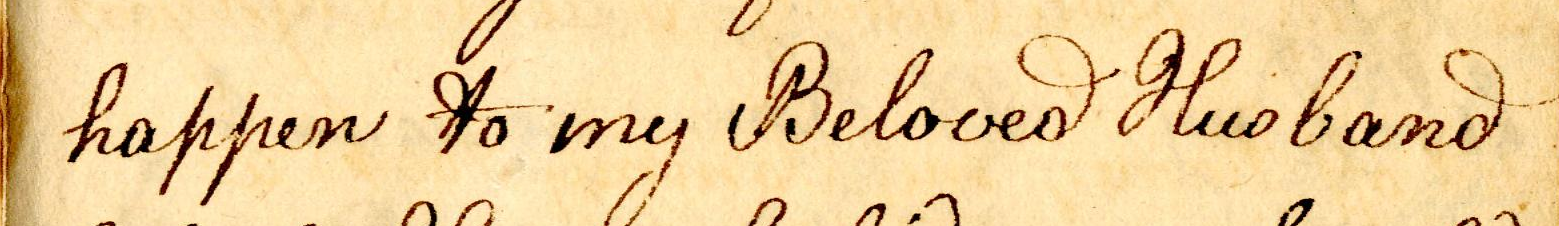happen to my Beloved Husband
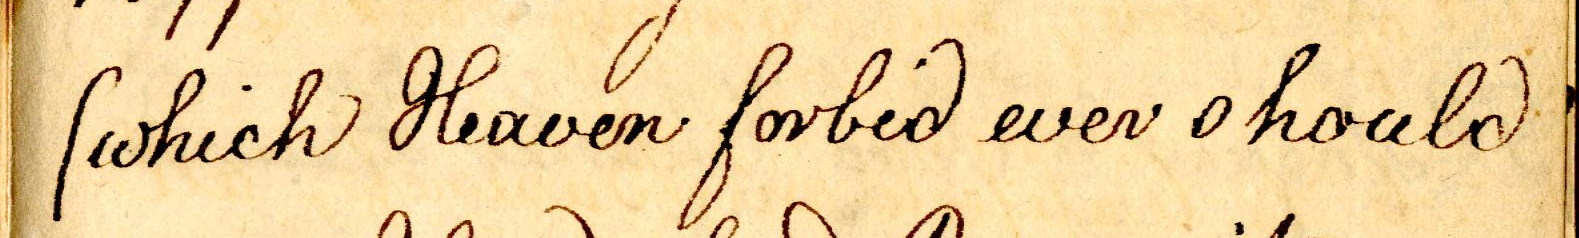(which Heaven forbid ever should
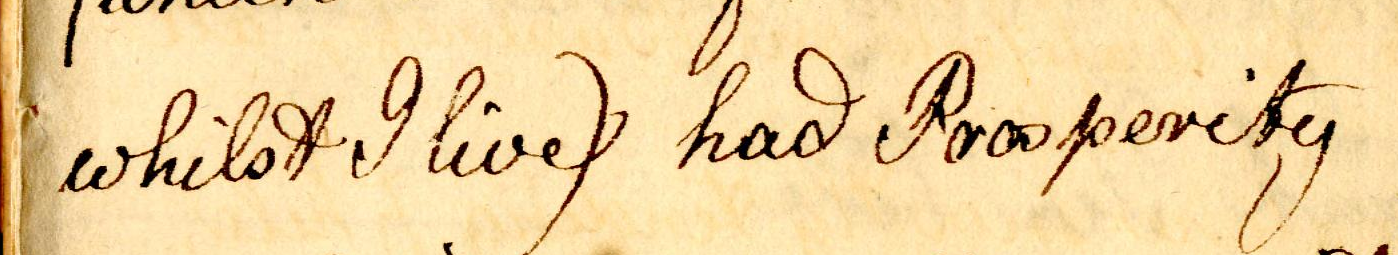whilst I live) had Prosperity
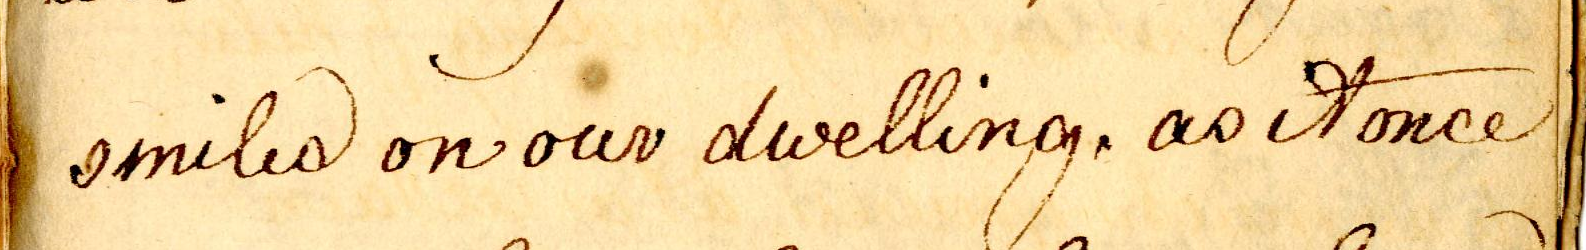smiled on our dwelling, as it once
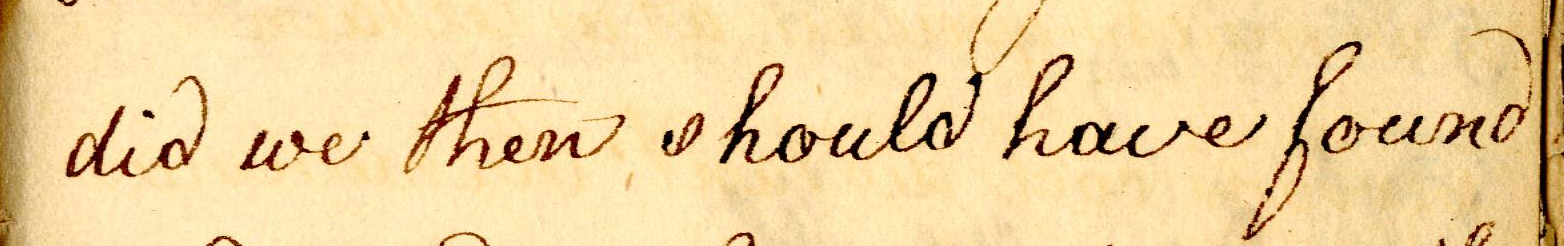did we then should have found
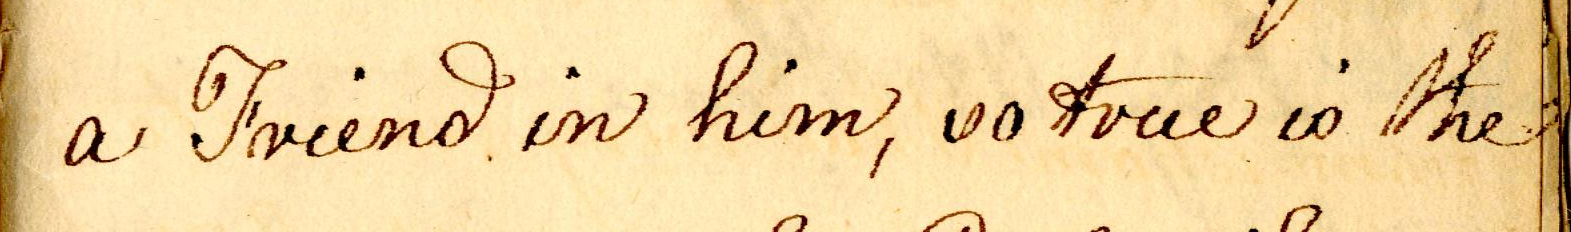a Friend in him, so true is the
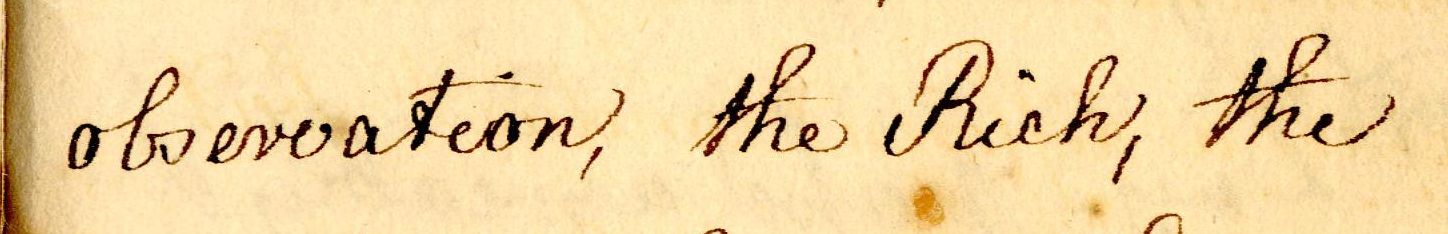observation, the Rich, the
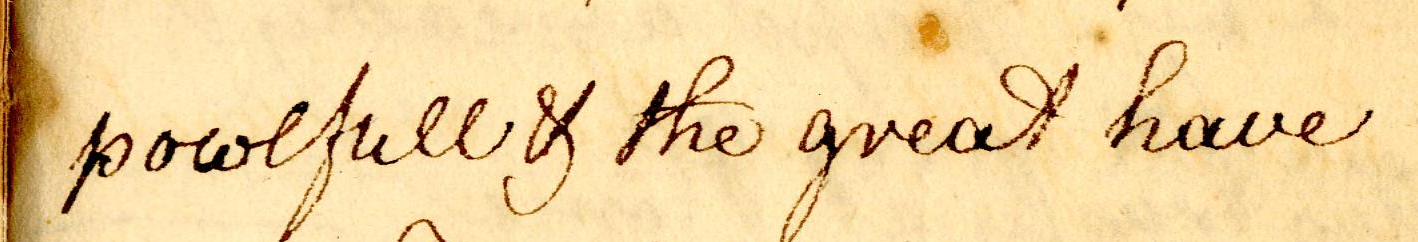powerfull & the great have
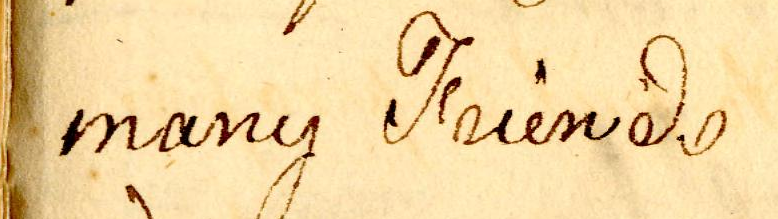many Friends
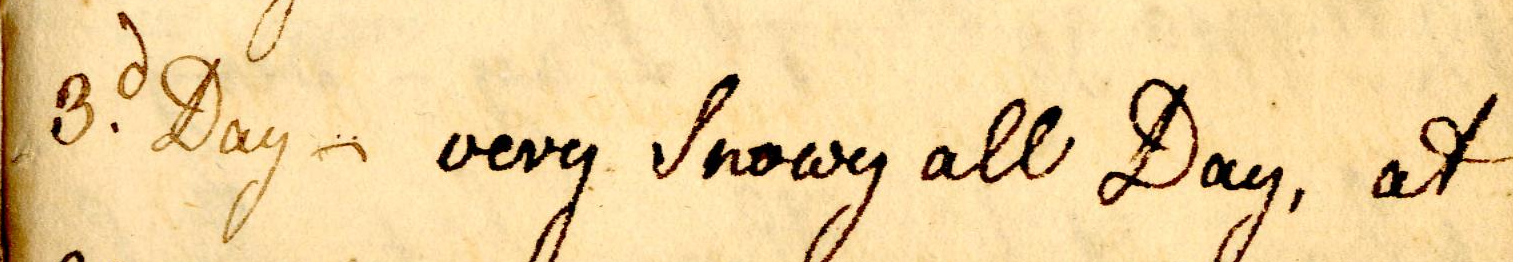3^d. Day- very Snowy all Day, at
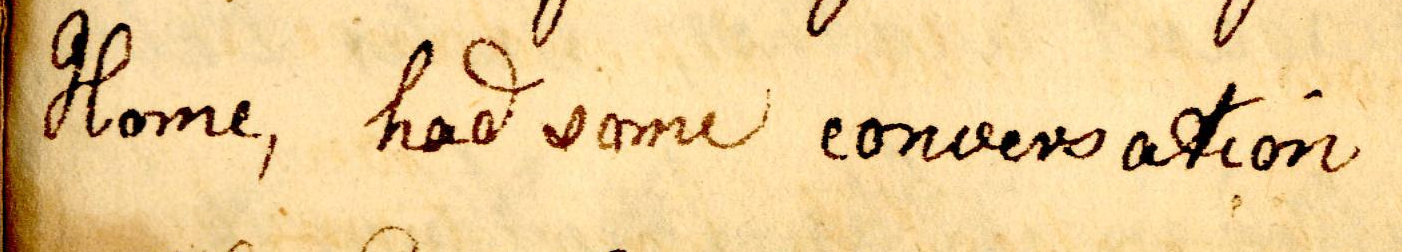Home, had some conversation
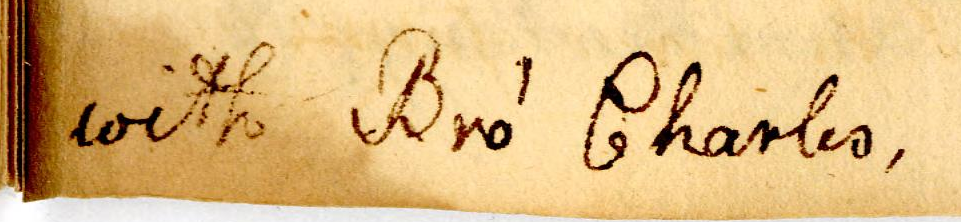with Bro' Charles,
